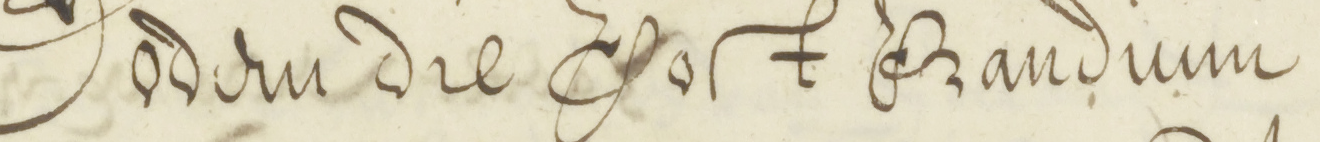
Eodem die Post Prandium
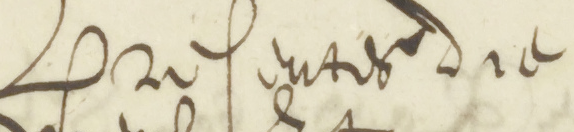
Presentes die
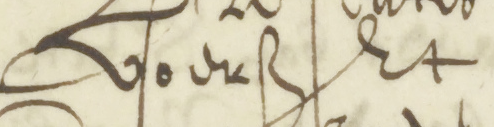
voers et
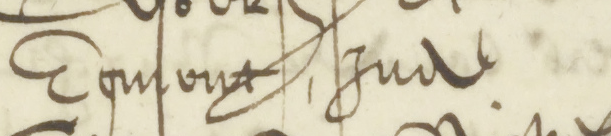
Egmont, Inde
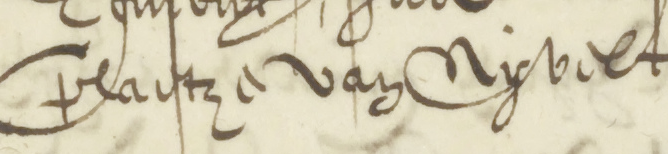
plaitze van Nijvelt
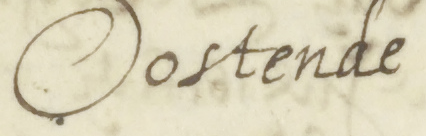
Oostende
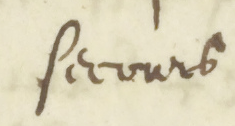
secours
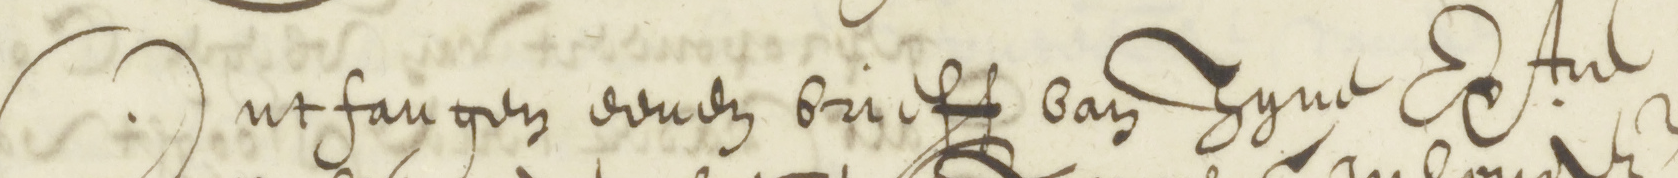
Ontfangen eenen brieff van Zyne Extie.
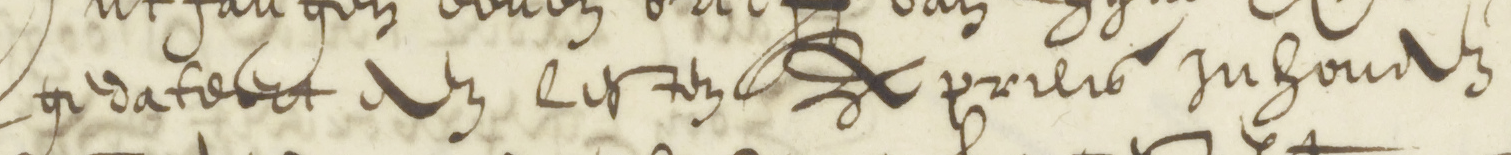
gedateert den lesten Aprilis inhouden
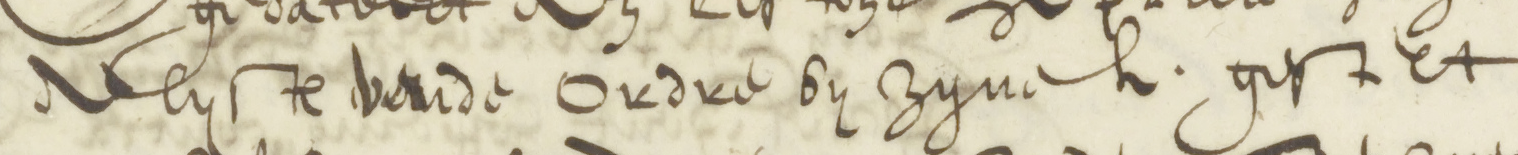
de lyste vande ordre by zyne L. gestelt
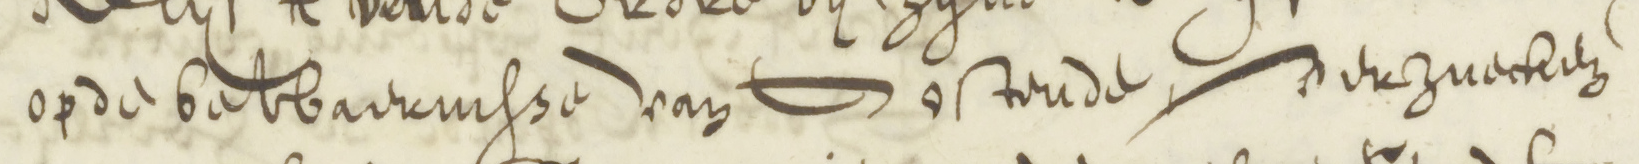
opde bewaernisse van Oostende, verzuecken
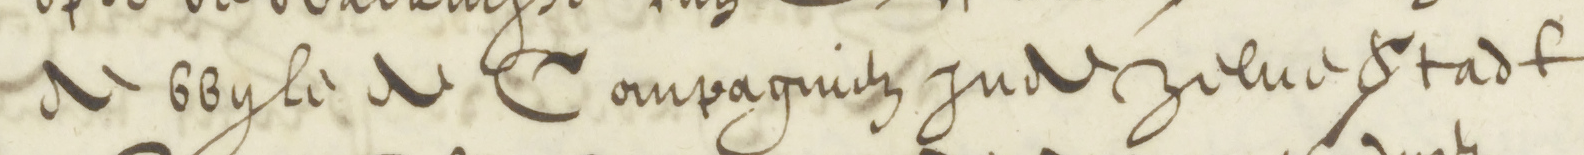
de wyle de Compagnien inde zelue Stadt
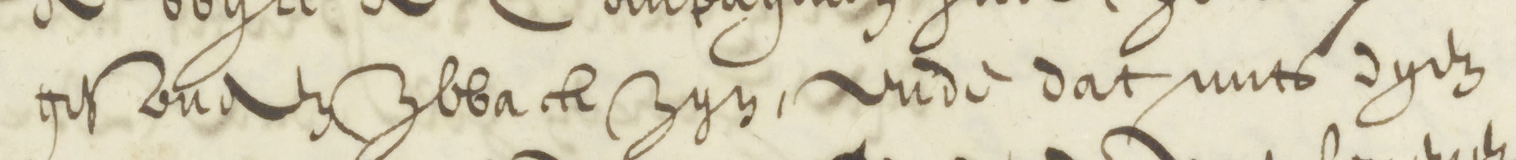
gesonden zwack zyn, ende dat mits dyen
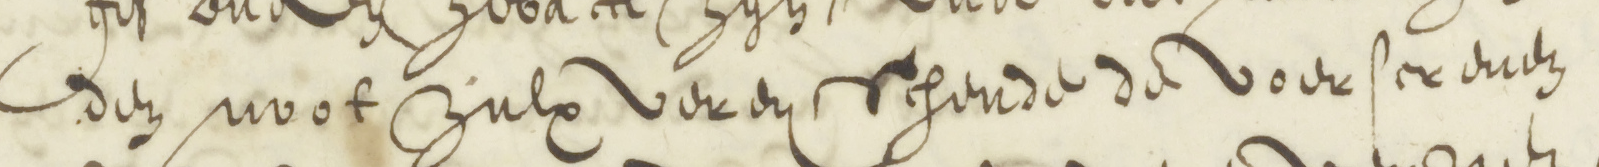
den noot zulx vereysschende de voerscreuen
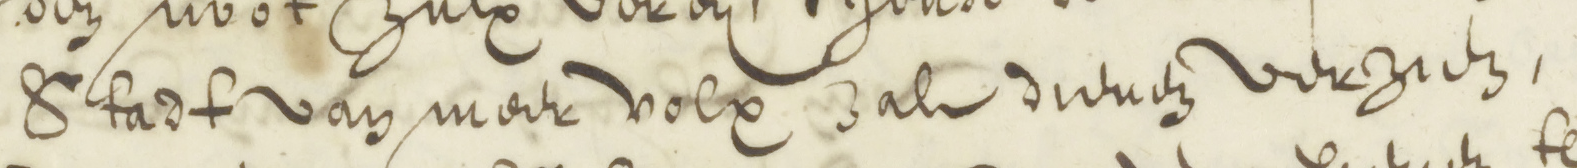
Stadt van meer volx zal dienen verzien,
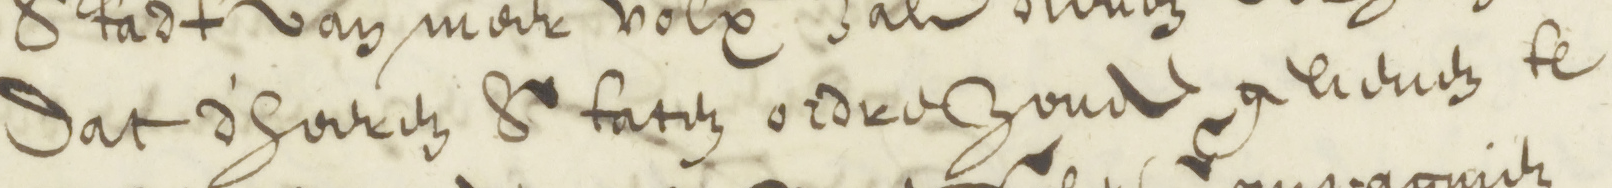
dat d‛heeren Staten ordre zoude gelieuen te
